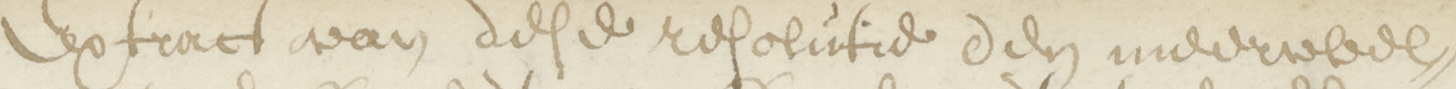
Extract van dese resolutie den meerwel„
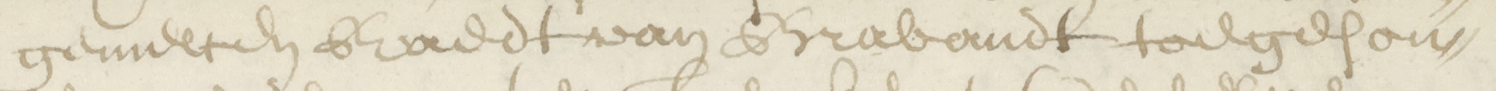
gemelten Raedt van Brabandt toegeson„
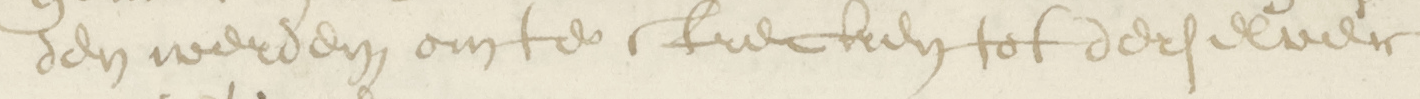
den werden, om te strecken tot derselver
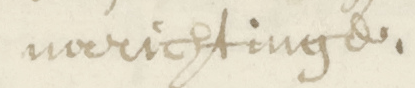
narichtinge.
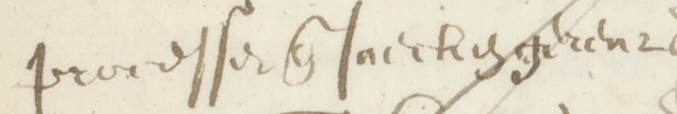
processen & saecken geren=
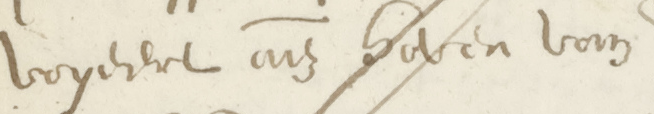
voyeert aen hoven van
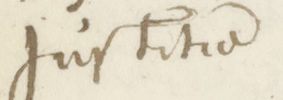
Justitie
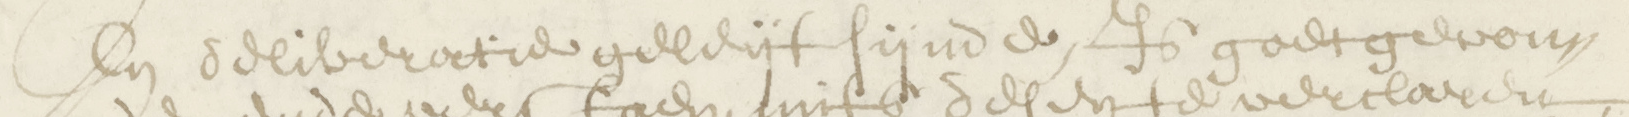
In deliberatie geleijt sijnde, is goetgevon„
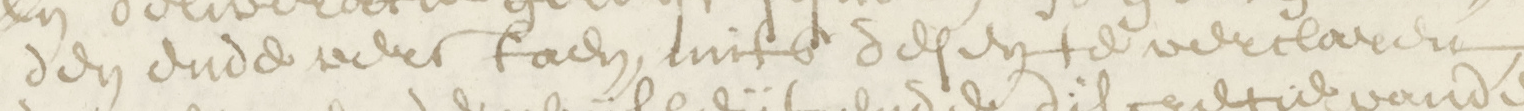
den ende verstaen, mits desen te verclaren
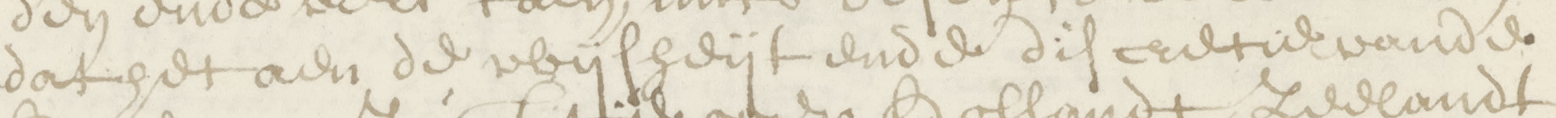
dat het aen de wijsheijt ende discretie vande
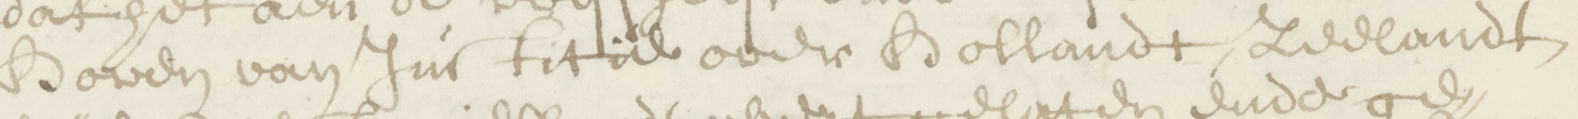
Hoven van Justitie over Hollandt Zeelandt,
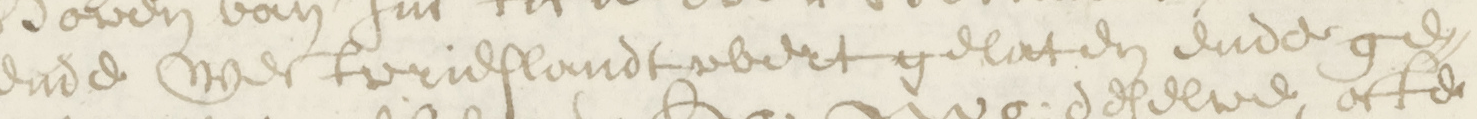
ende Westvrieslandt wert gelaten ende ge,,
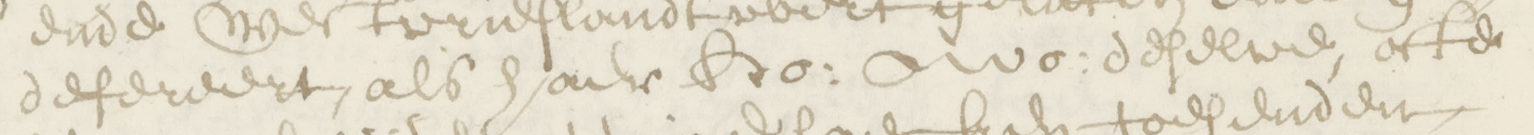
defereert, als haer Ho:Mo: deselve ofte
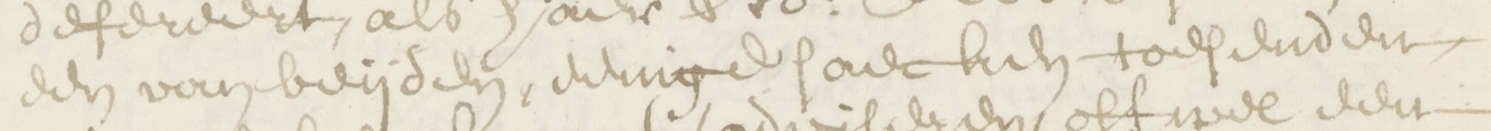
een van beijden, eenige saecken toesenden
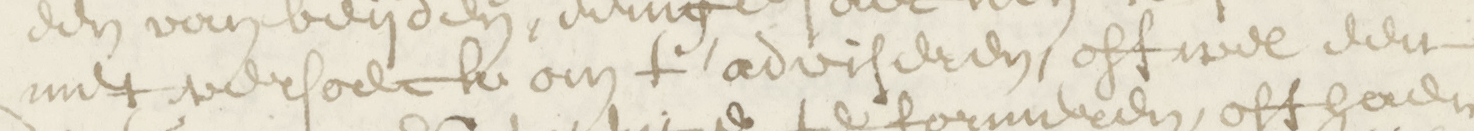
met versoeck om t‛adviseren, oftwel een
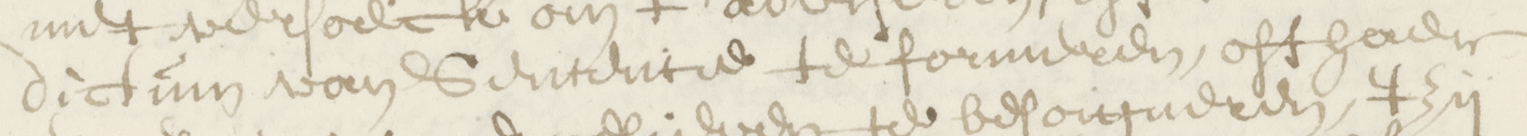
dictum van Sententie te formeren, oft haer
